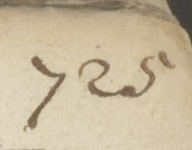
725
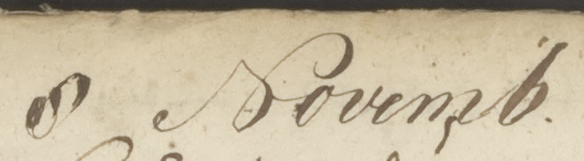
8 Novemb.
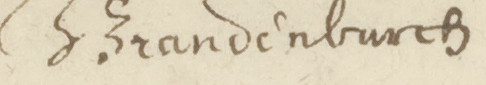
Brandenburch
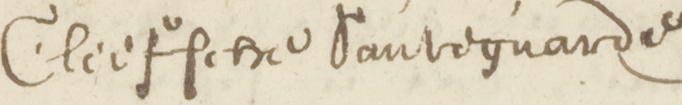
Cleefsche Sauveguarde
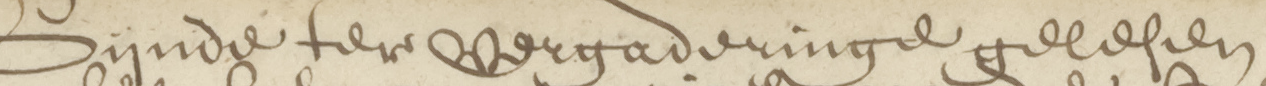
Sijnde ter Vergaderinge gelesen
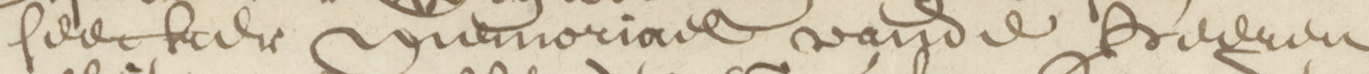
seecker Memoriael vande Heeren
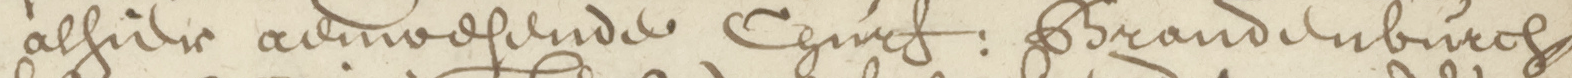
alhier aenwesende Churf: Brandenburch„
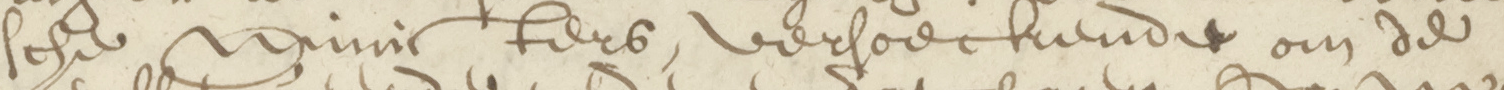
sche Ministers, versoeckende om de
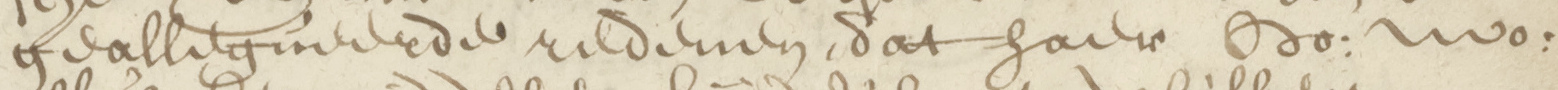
geallegueerde redenen, dat haer Ho:Mo:
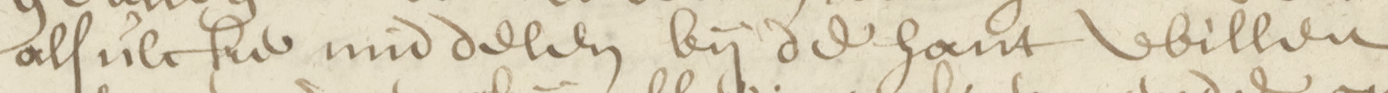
alsulcke middelen bij de hant willen
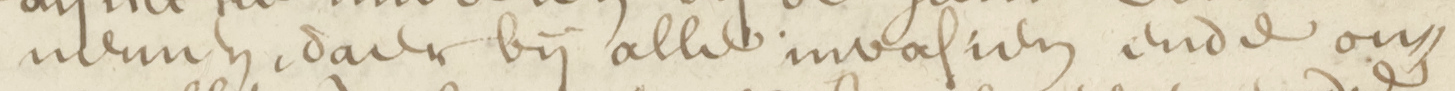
nemen, daer bij alle invasien ende on„
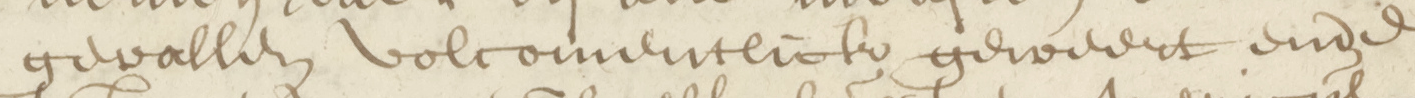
gevallen volcomentlick geweert ende
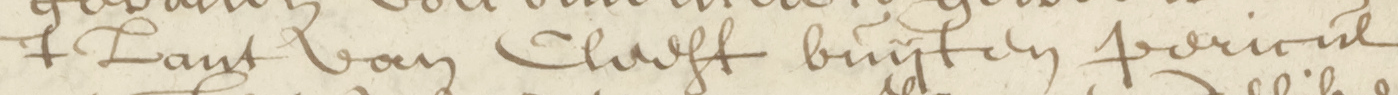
‛t Lant van Cleeff buijten pericul
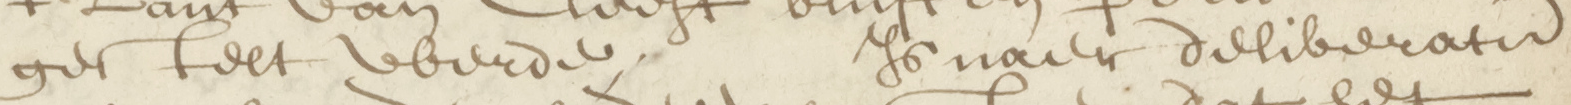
gestelt werde, Is naer deliberatie
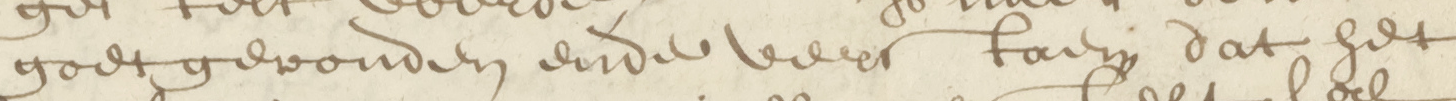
goetgevonden ende verstaen dat het
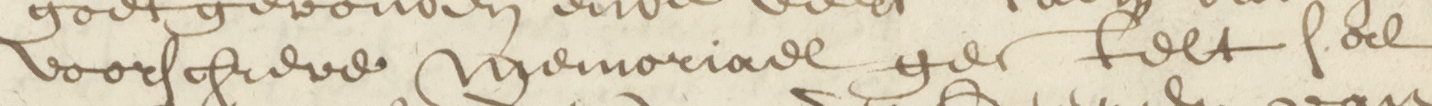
voorschreve Memoriael gestelt sal
